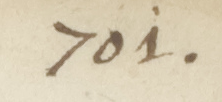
701.
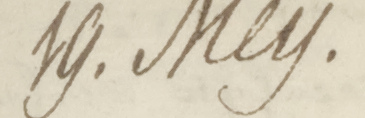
19. Meij.
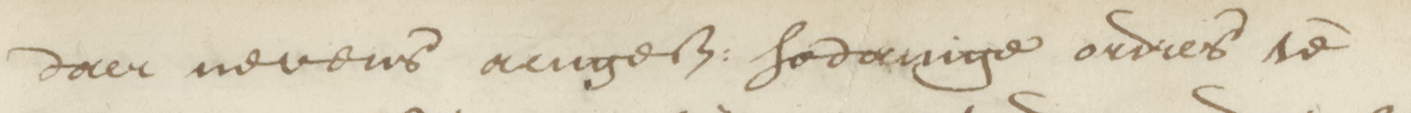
daer nevens aenges: sodanige ordres te
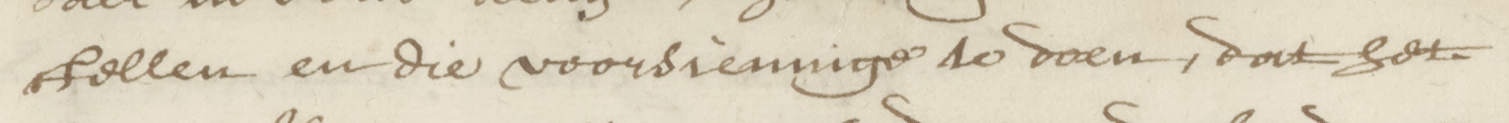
stellen en die voorsieninge te doen, dat het
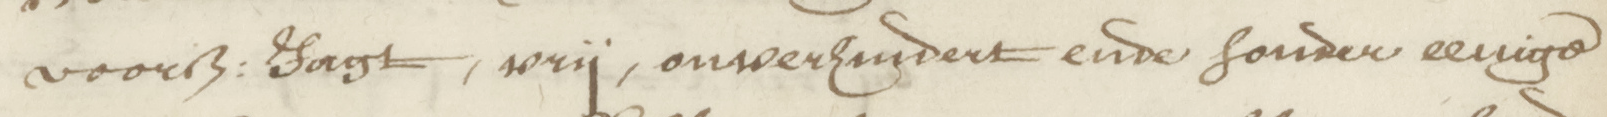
voors: jagt, vrij, onverhindert ende sonder eenige
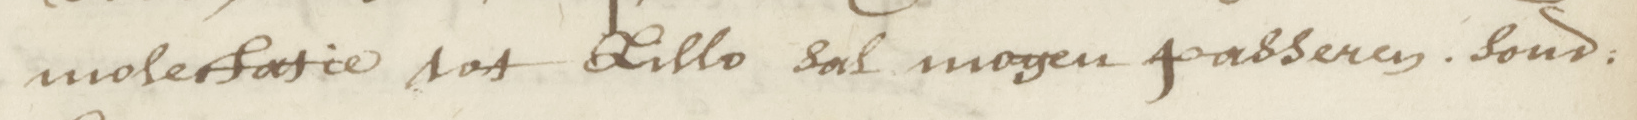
molestatie tot Lillo sal mogen passeren, sond:
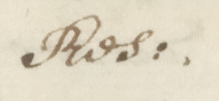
Res:
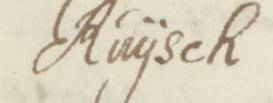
Ruijsch
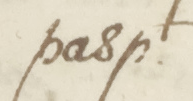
paspt.
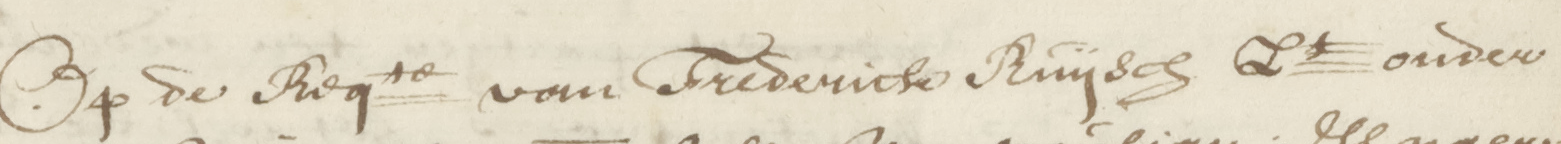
Op de Reqte van Frederick Ruijsch Lt onder
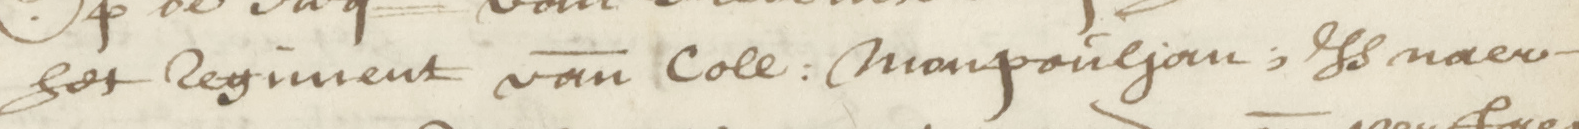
het regiment van Coll: Manpouljan: Is nae
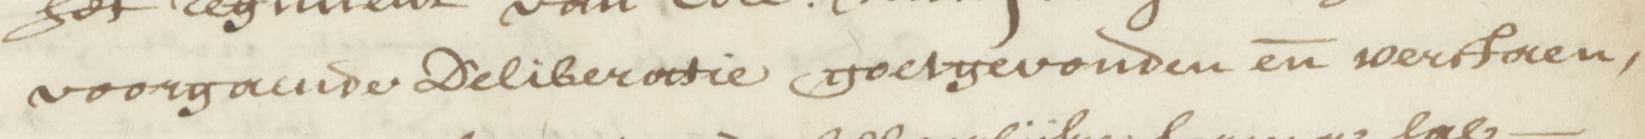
voorgaende deliberatie goetgevonden en verstaen,
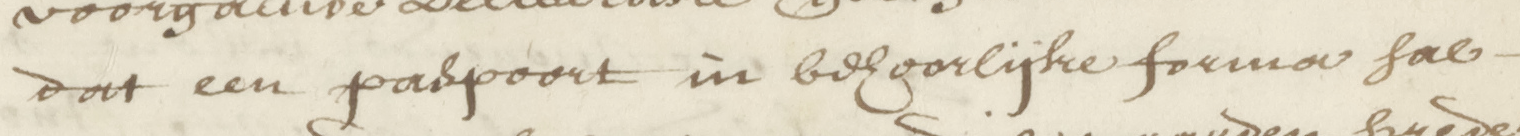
dat een paspoort in behoorlijke forma sal
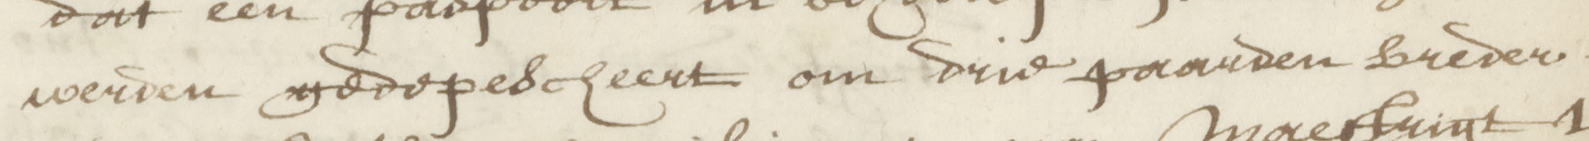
werden gedepescheert om drie paarden breder
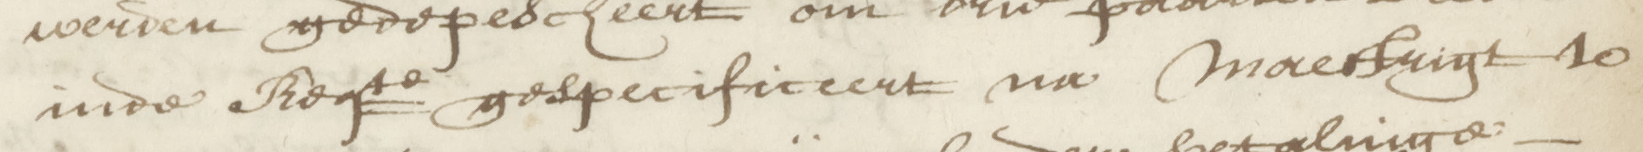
inde Reqte gespecificeert na Maestrigt te
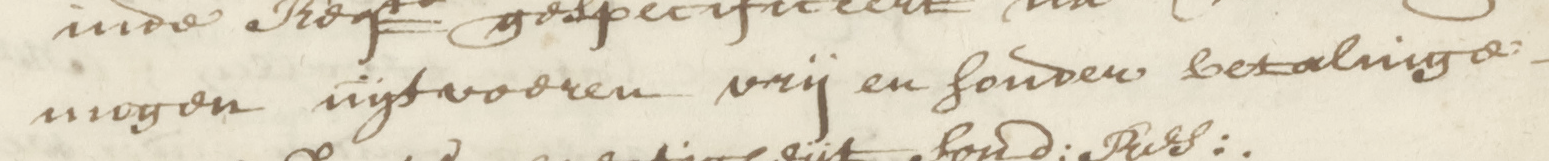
mogen uijtvoeren vrij en sonder betalinge
